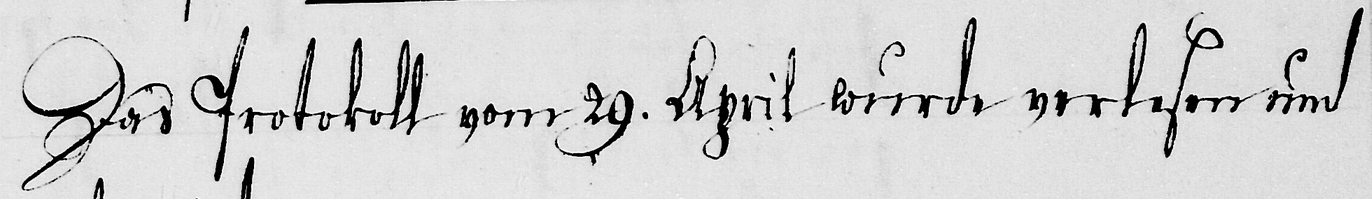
Das Protokoll vom 29. April wurde verlesen und
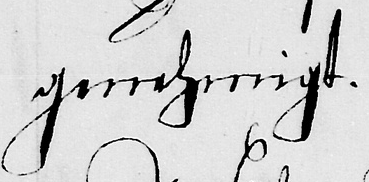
genehmigt.
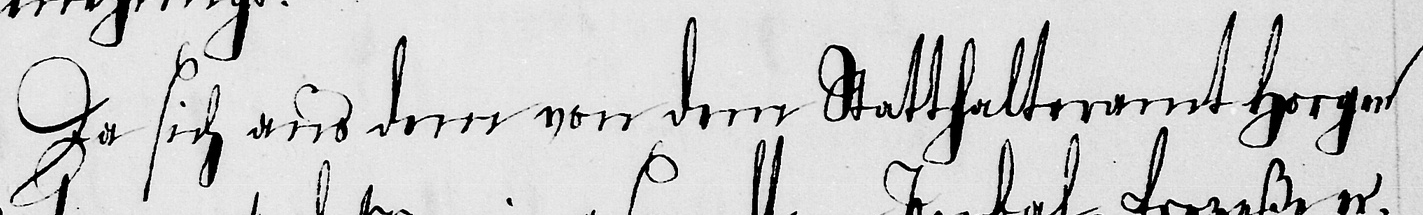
Da sich aus dem von dem Statthalteramt Horgen
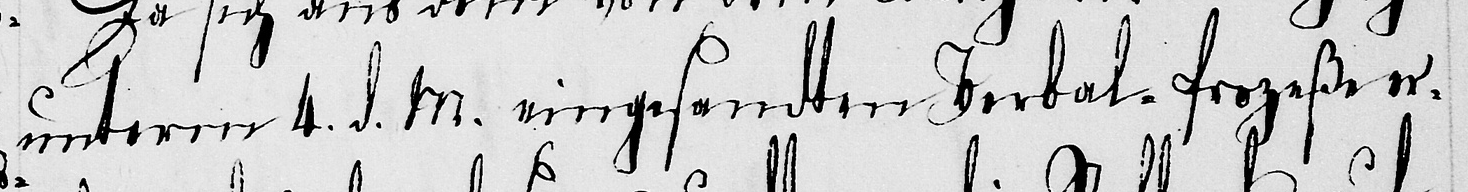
unterm 4. d. M. eingesandten Verbal-Prozeße er¬
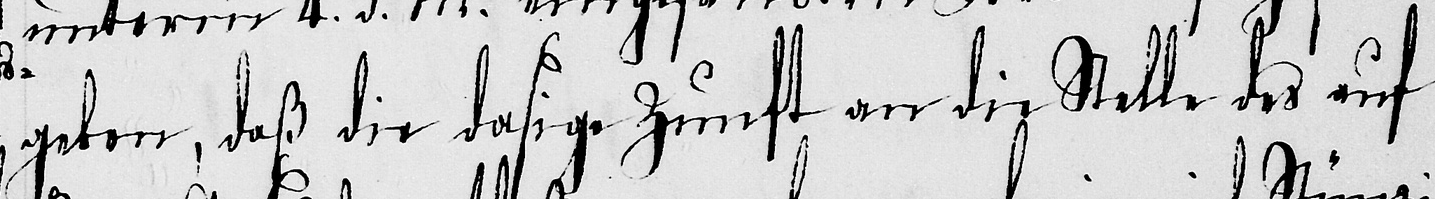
geben, daß die dasige Zunft an die Stelle des auf
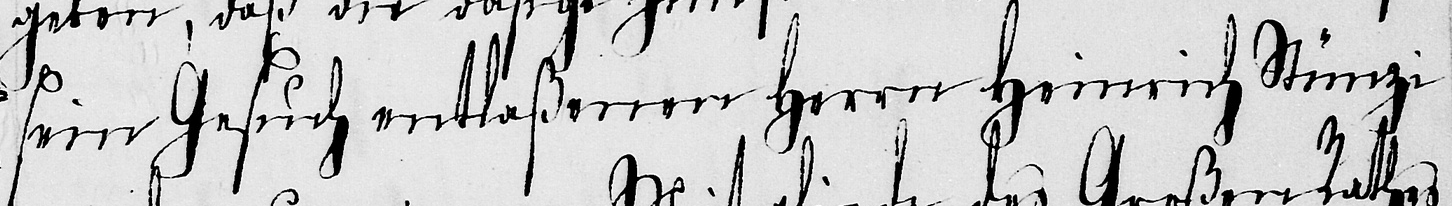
sein Gesuch entlaßenen Herrn Heinrich Stünzi
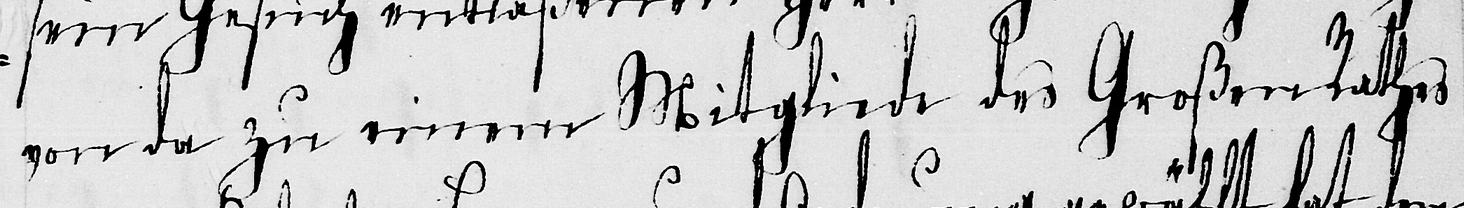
von da zu einem Mitgliede des Großen Rathes
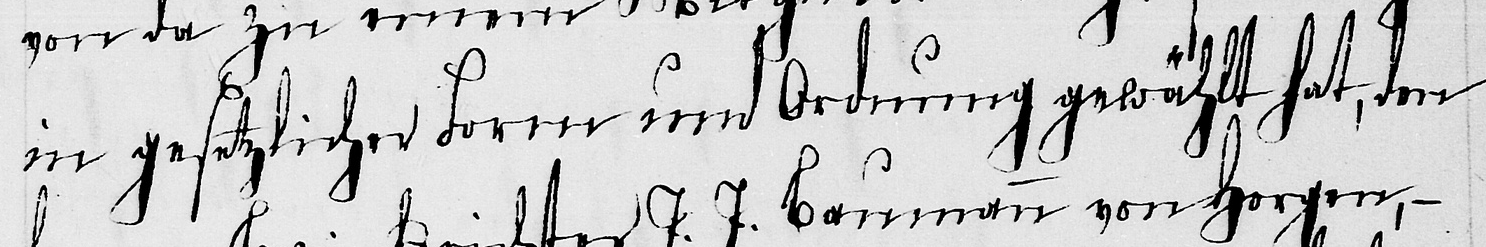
in gesetzlicher Form und Ordnung gewählt hat, den
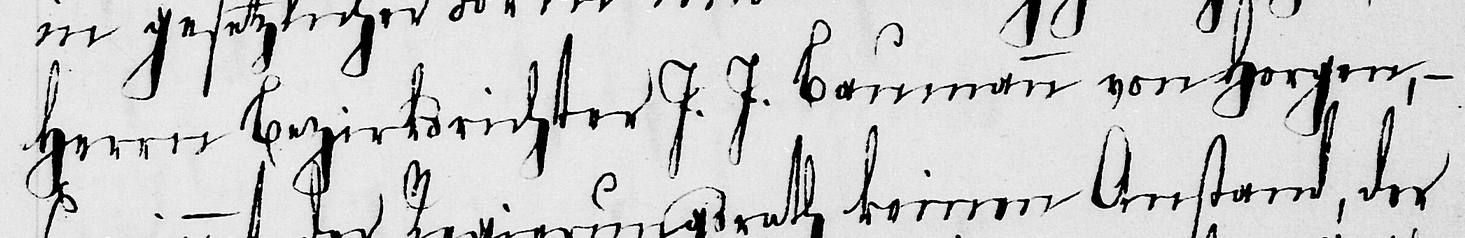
Herrn Bezirksrichter J. J. Baumann von Horgen,
